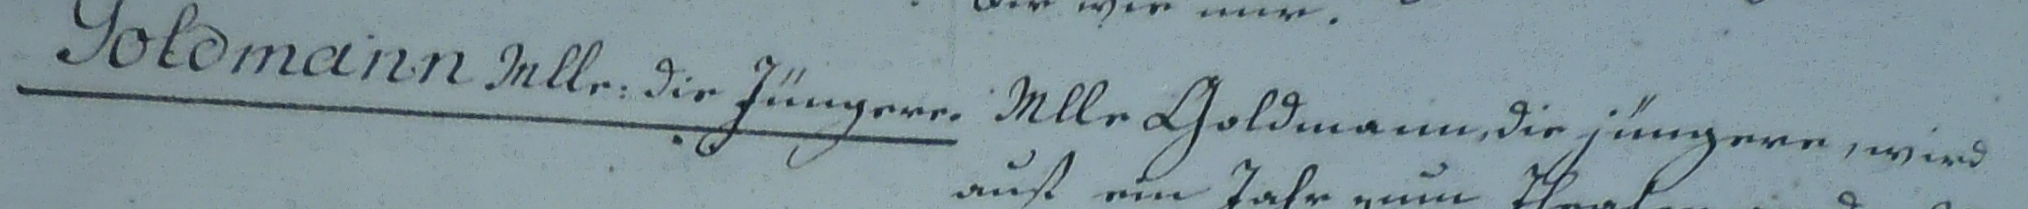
Goldmann Mlle: die Jüngere. Mlle Goldmann, die jüngere, wird
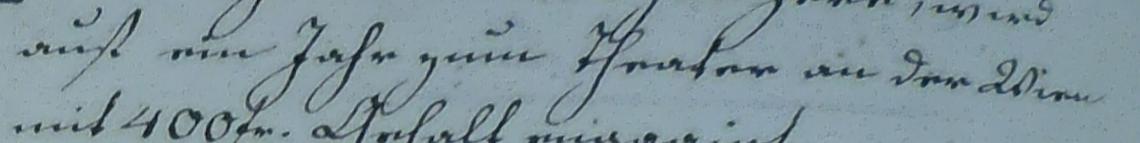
auf ein Jahr zum Theater an der Wien
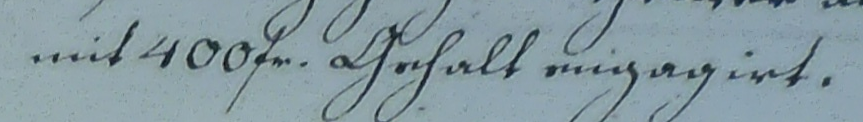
mit 400fr. Gehalt engagirt.
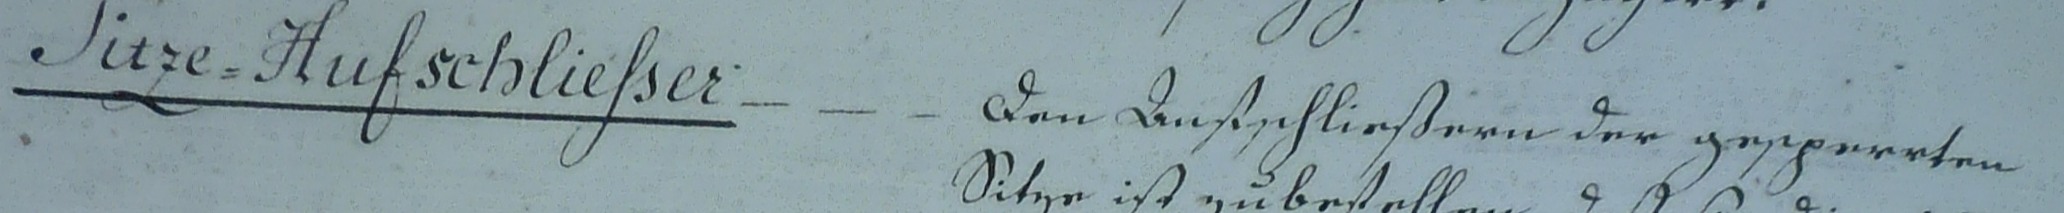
Sitze‗Aufschliesser _ _ _ Den Aufschließern der gesperrten
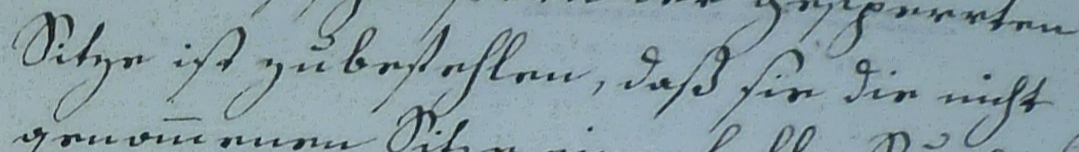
Sitze ist zubestellen, daß sie die nicht
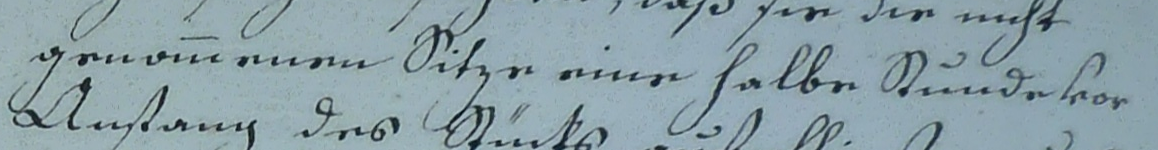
genom̅enen Sitze eine halbe Stunde vor
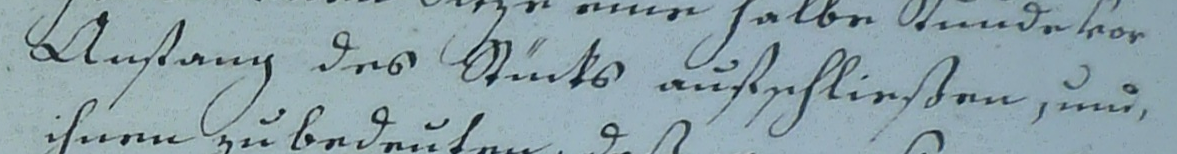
Anfang des Stücks aufschließen, und,
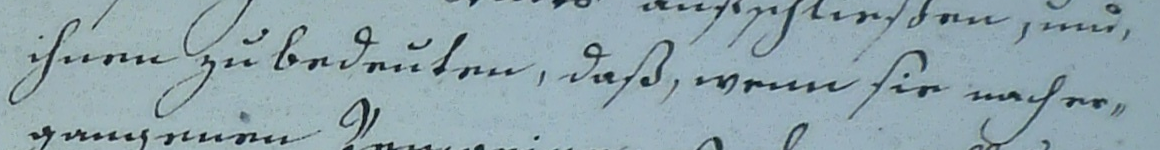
ihnen zubedeuten, daß, wenn sie nacher¬
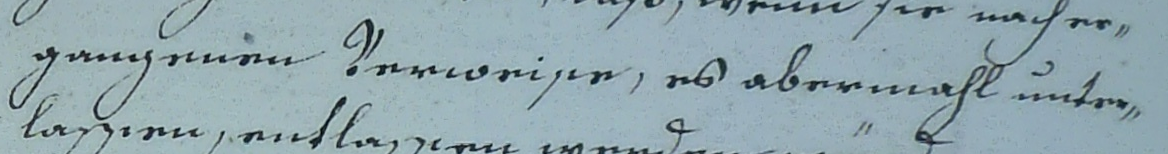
gangenen Verweise, es abermahl unter¬
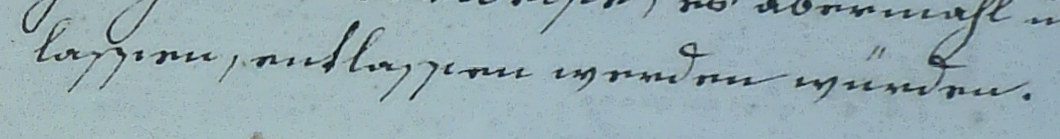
lassen, entlassen werden würden.
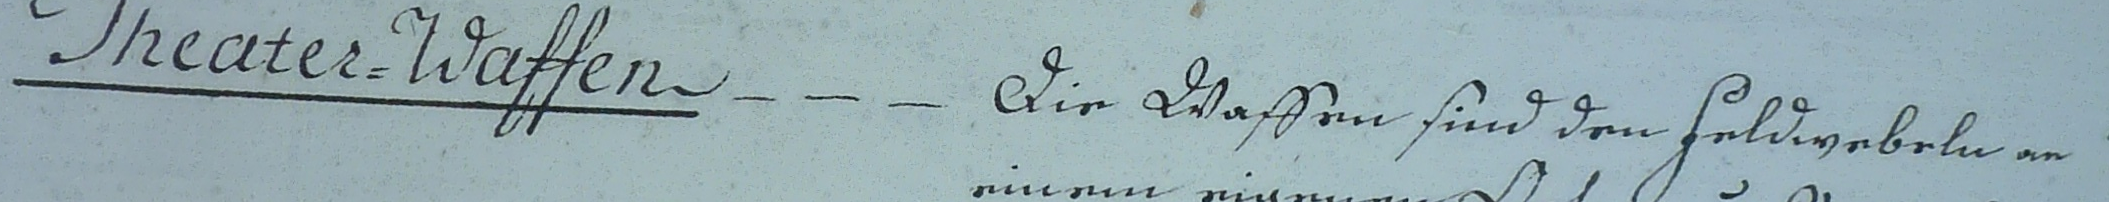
Theater‗Waffen _ _ _ Die Waffen sind den Feldwebeln an
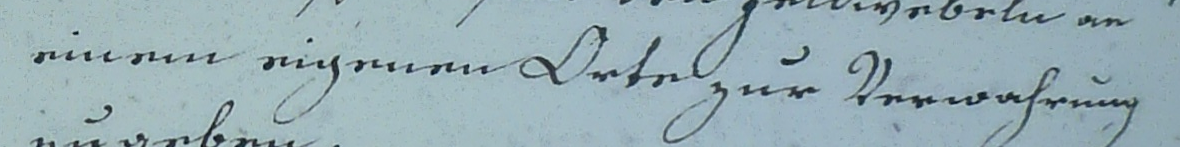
einem eigenen Orte zur Verwahrung
